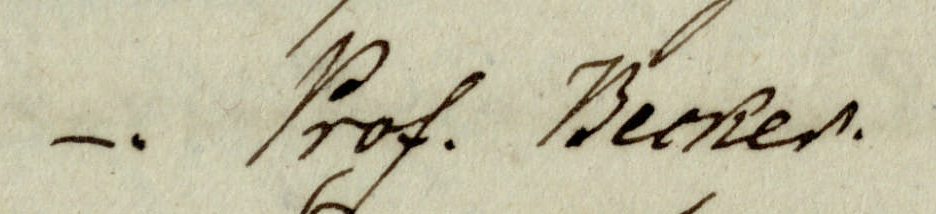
Prof. Becker.
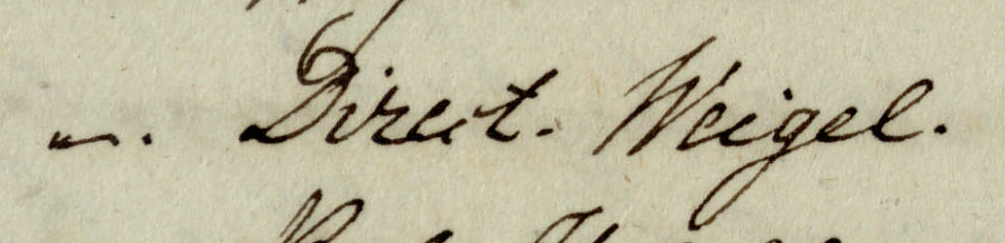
Direct. Weigel.
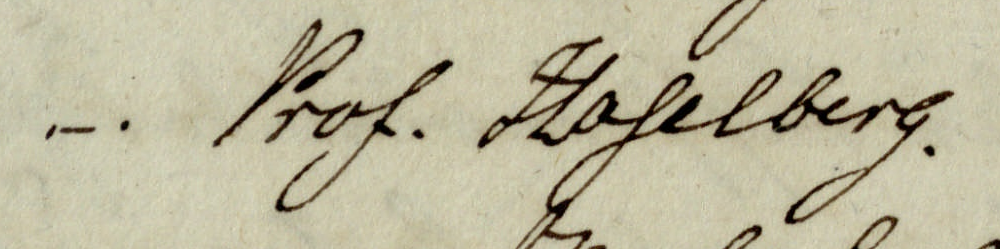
Prof. Haselberg.
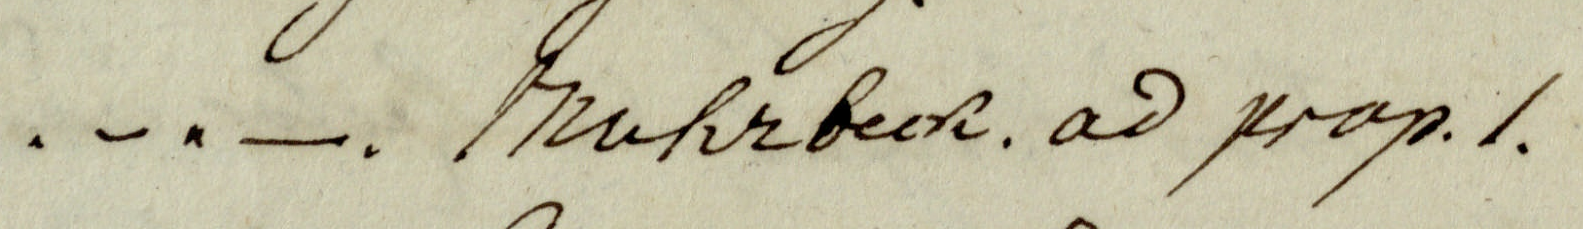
Muhrbeck. ad prop. 1.
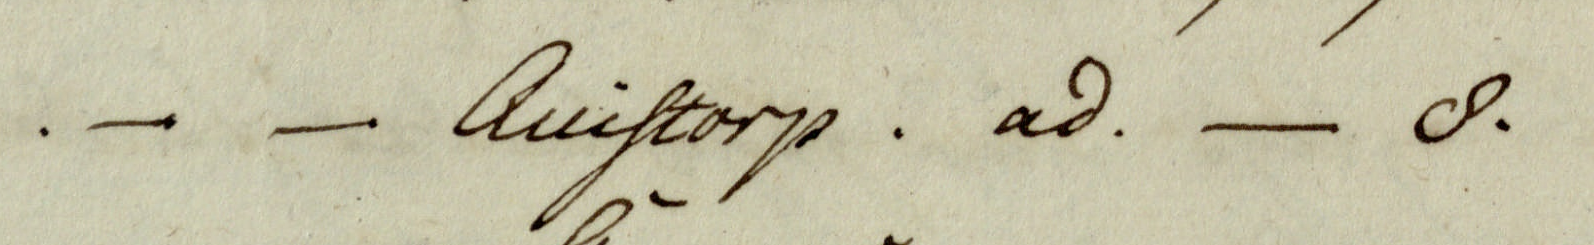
Quistorp. ad. 8.
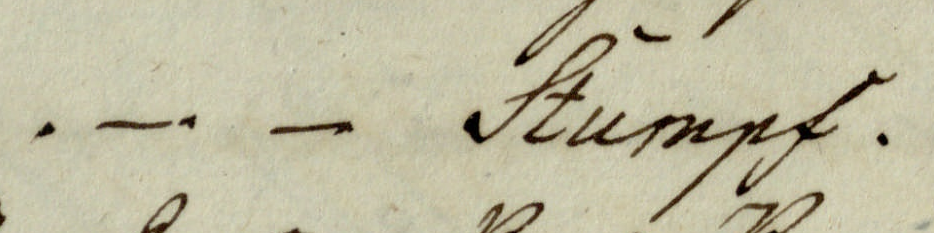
Stumpf.
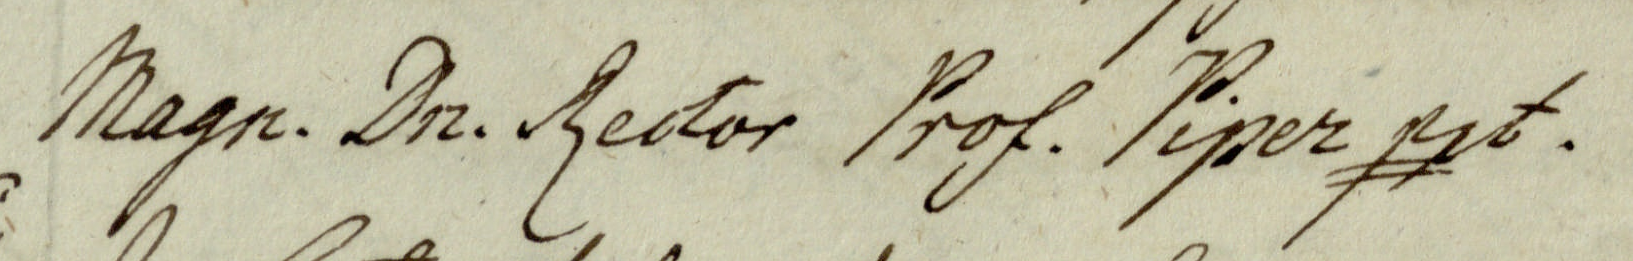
Magn. Dn. Rector Prof. Piper ppt.
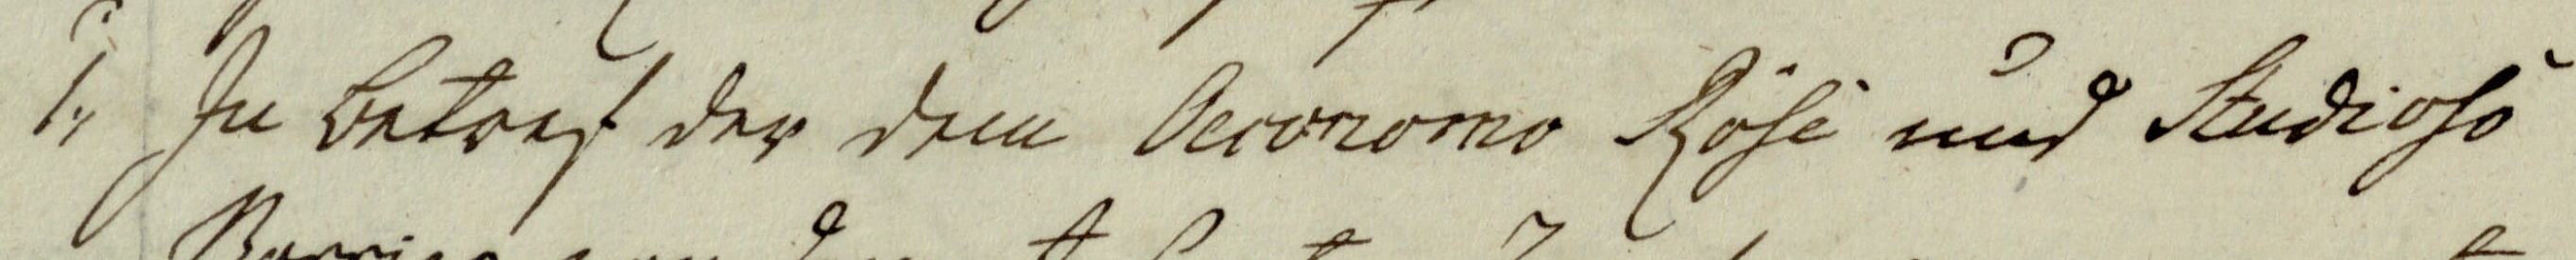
1., In Betref der dem Oeconomo Röse und Studioso
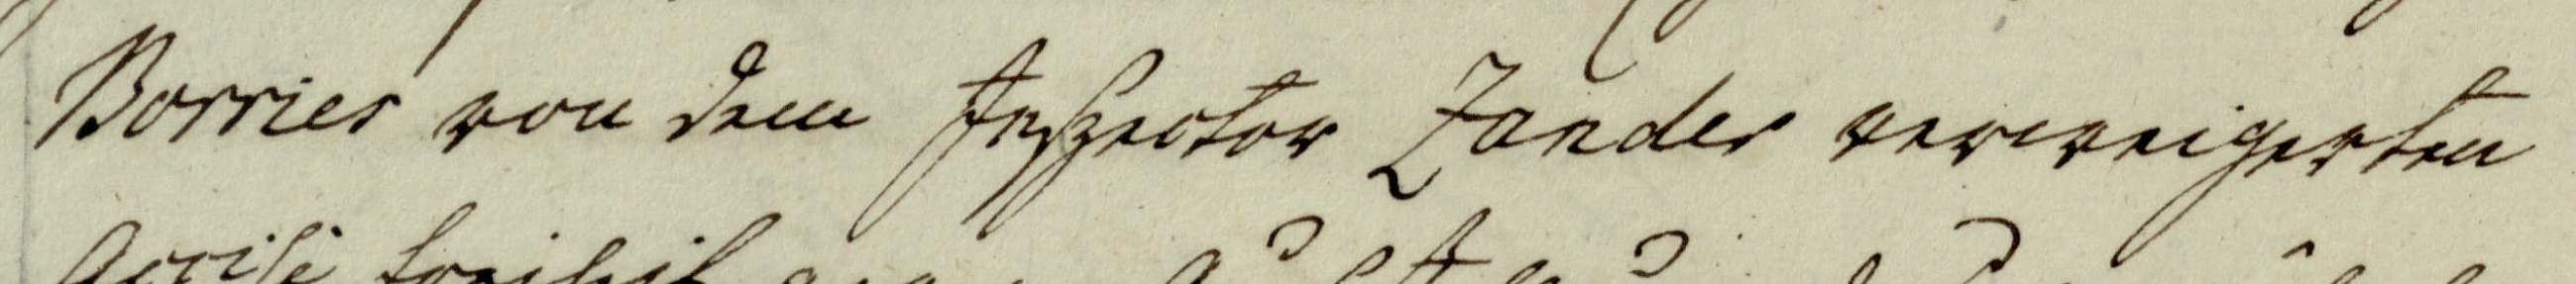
Borries von dem Inspector Zander verweigerten
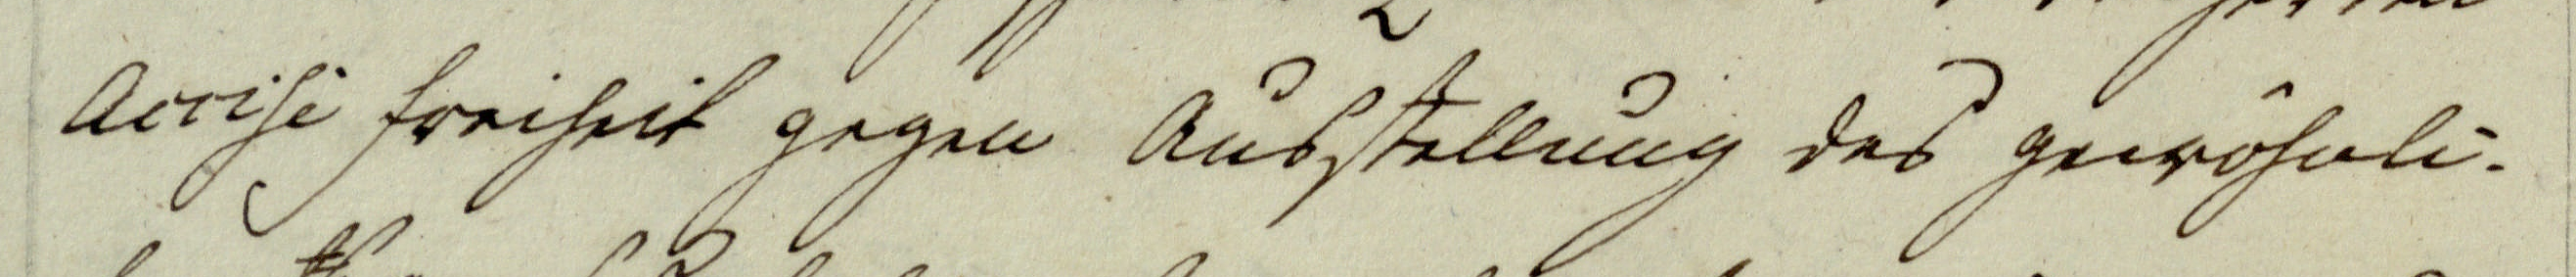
Accisi Freiheit gegen Ausstellung des gewöhnli¬
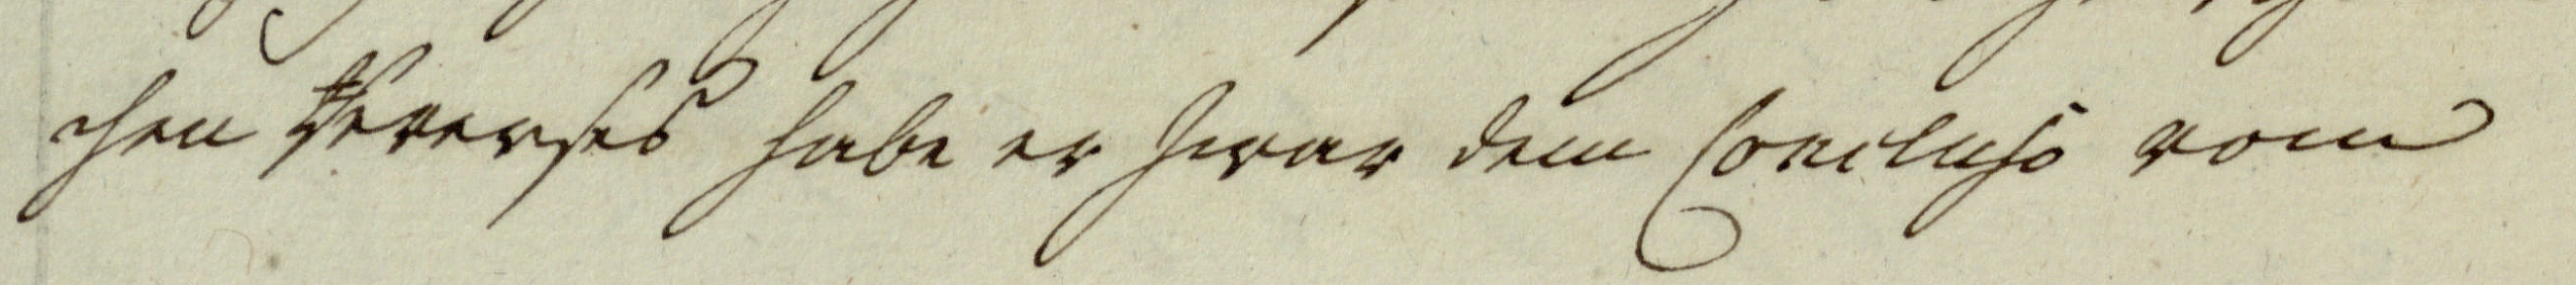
chen Reverses habe er zwar dem Concluso vom
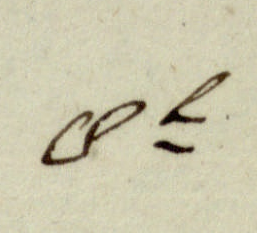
8 t
